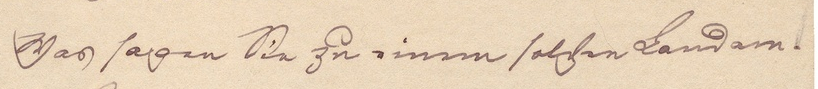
Was sagen Sie zu einem solchen Landam-
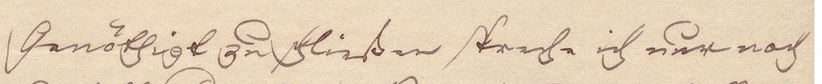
Genöthigt zu schließen spreche ich nur noch
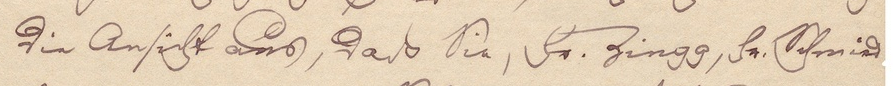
die Ansicht aus, daß Sie, Hr. Zingg, Hr. Schmied-
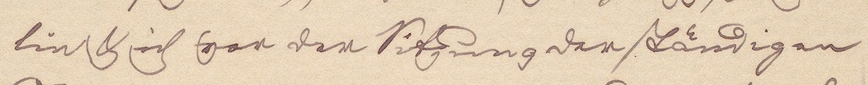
lin & ich vor der Sitzung der ständigen
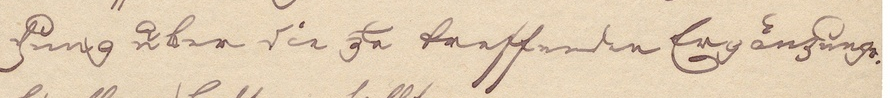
chung über die zu treffenden Ergänzungs-
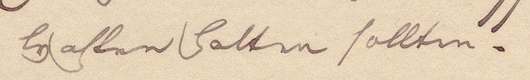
wahlen halten sollten.
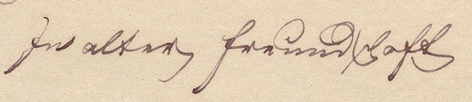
In alter Freundschaft
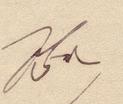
Escher.
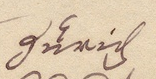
Zürich
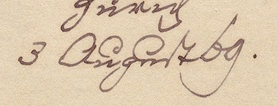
3. August 69.
